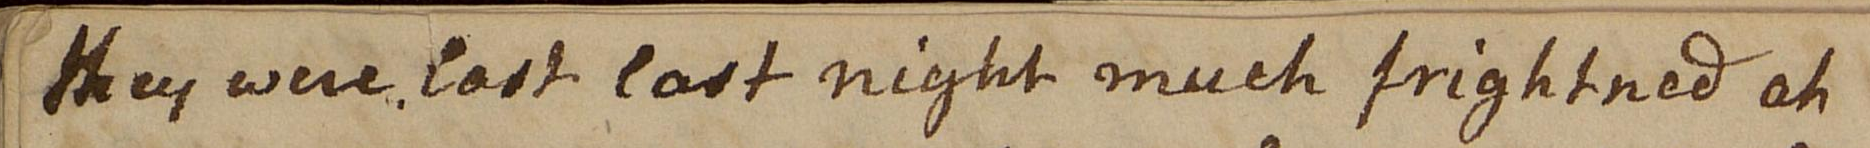they were last last night much frightned at
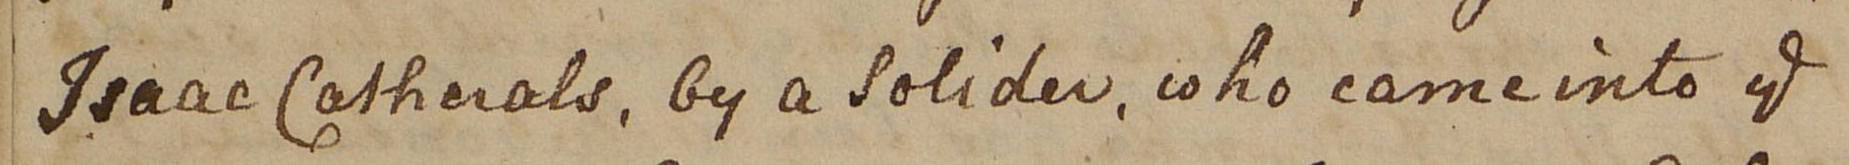Isaac Catherals, by a Solider, who came into y^e
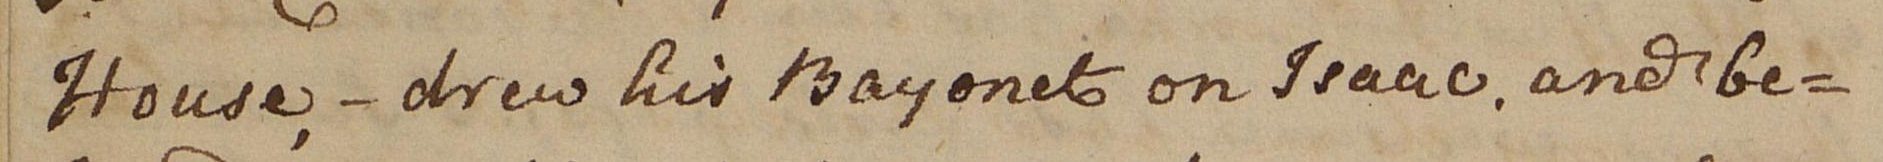House- drew his Bayonet on Isaac, and be-
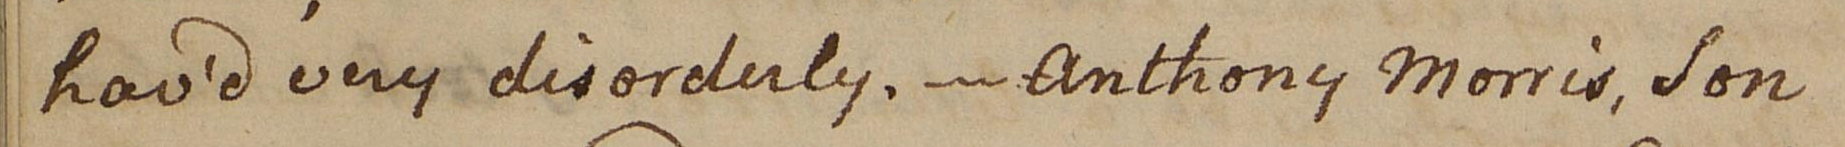hav'd very disorderly.- Anthony Morris, Son
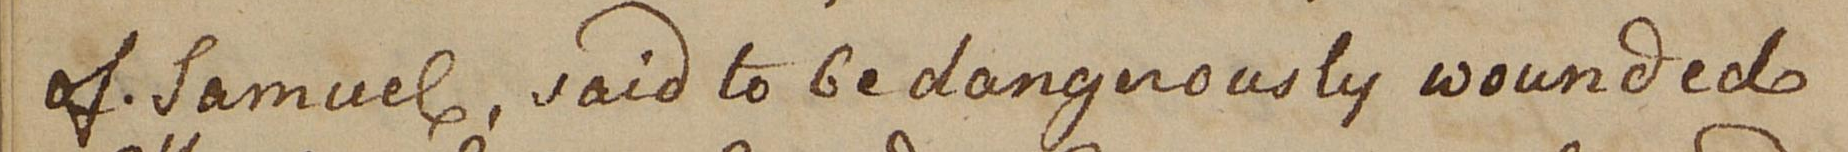of Samuel, said to be dangerously wounded
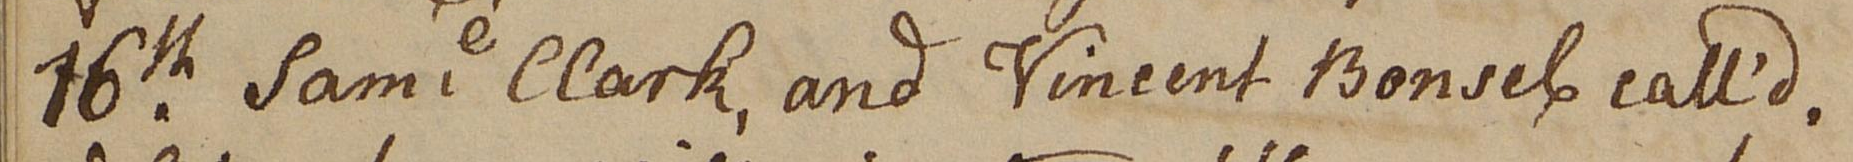16^th. Sam^l. Clark, and Vincent Bonsel call'd.
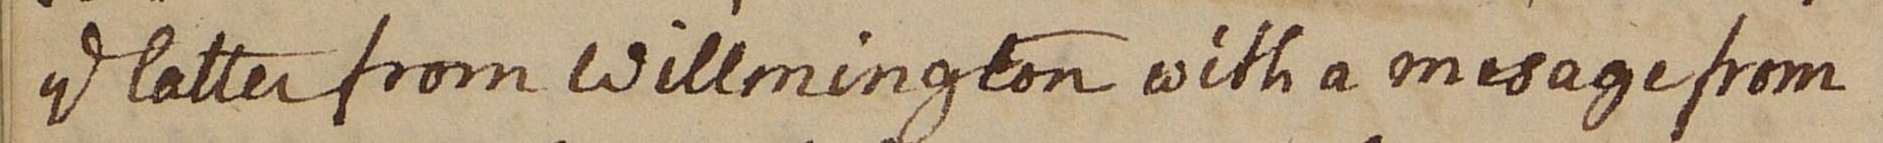y^e latter from Willmington with a mesage from
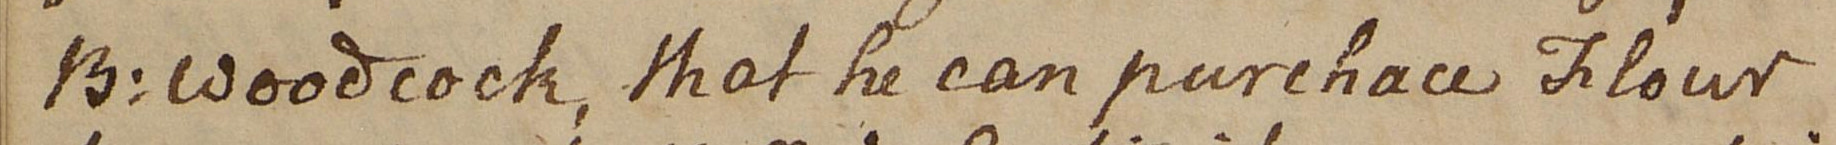B: Woodcock, that he can purchace Flour
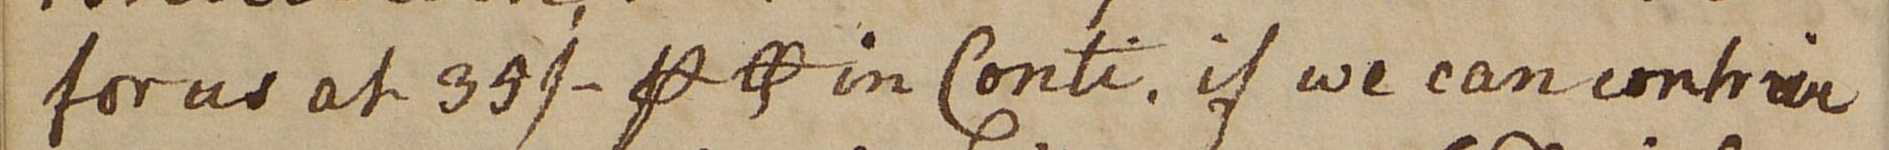for us at 35s- per & in Conti. if we can contrive
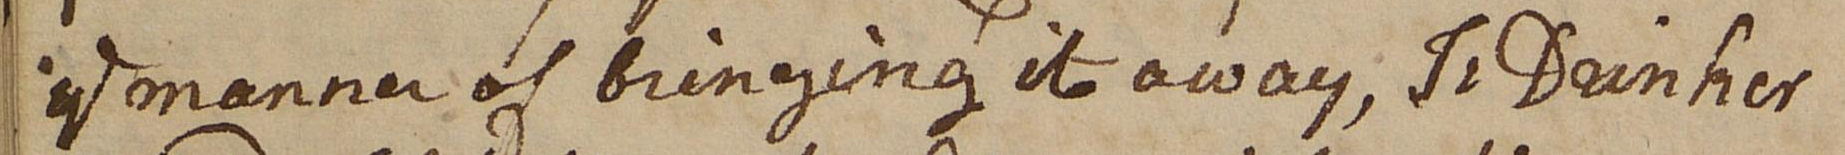y^e manner of bringing it away, I. Drinker
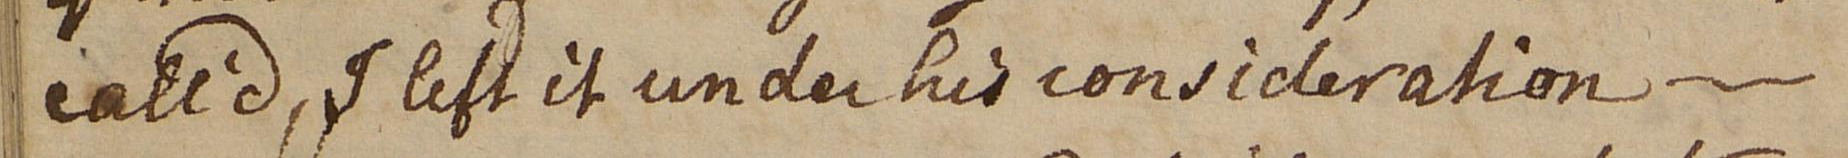call'd, I left it under his consideration-
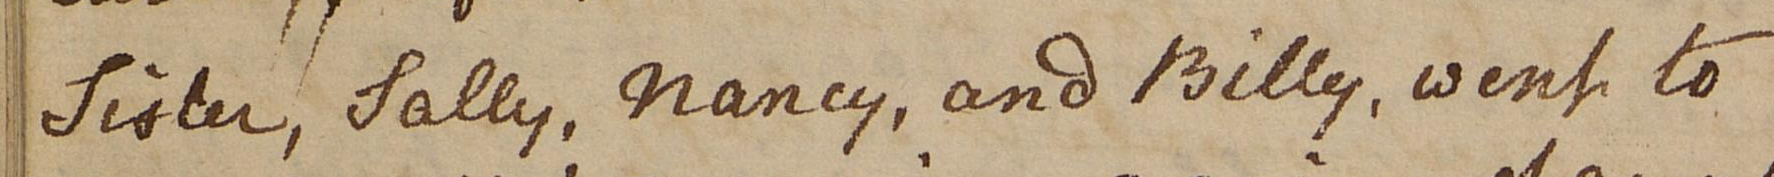Sister, Sally, Nancy, and Billy, went to
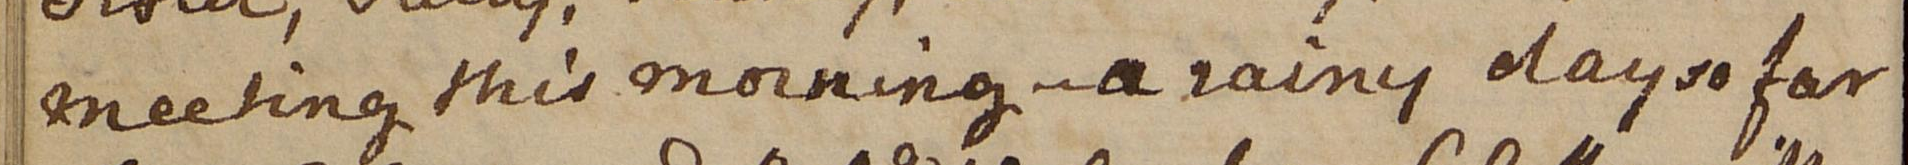meeting this morning -a rainy day so far
